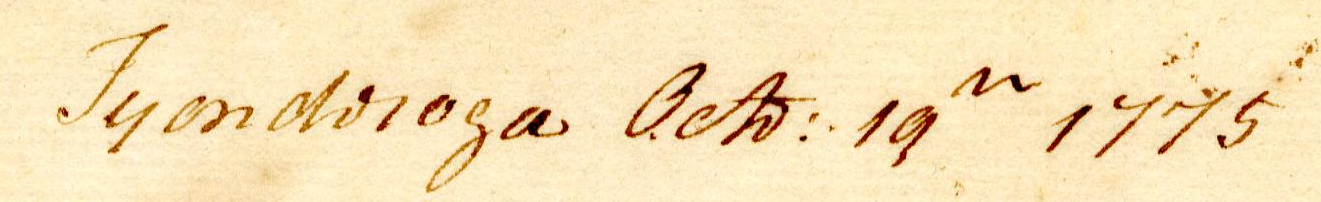Tyondoroga Octp: 19^th 1775
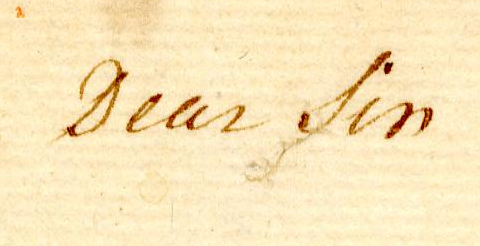Dear Sir
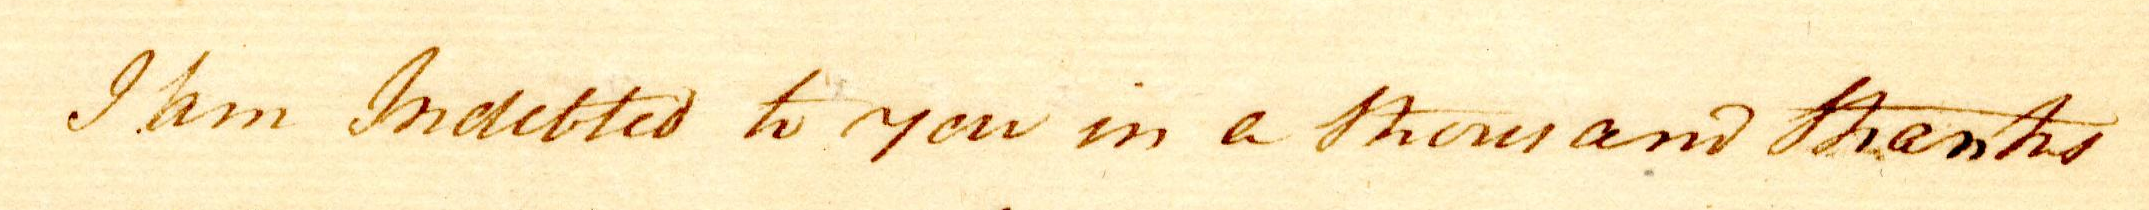I am Indebted to you in a thousand thanks
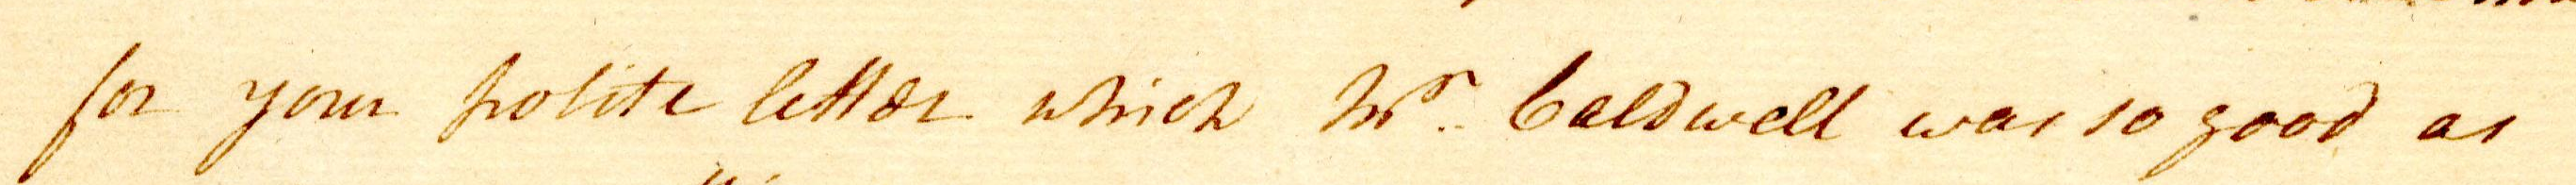for your polite letter which M^r. Caldwell was so good as
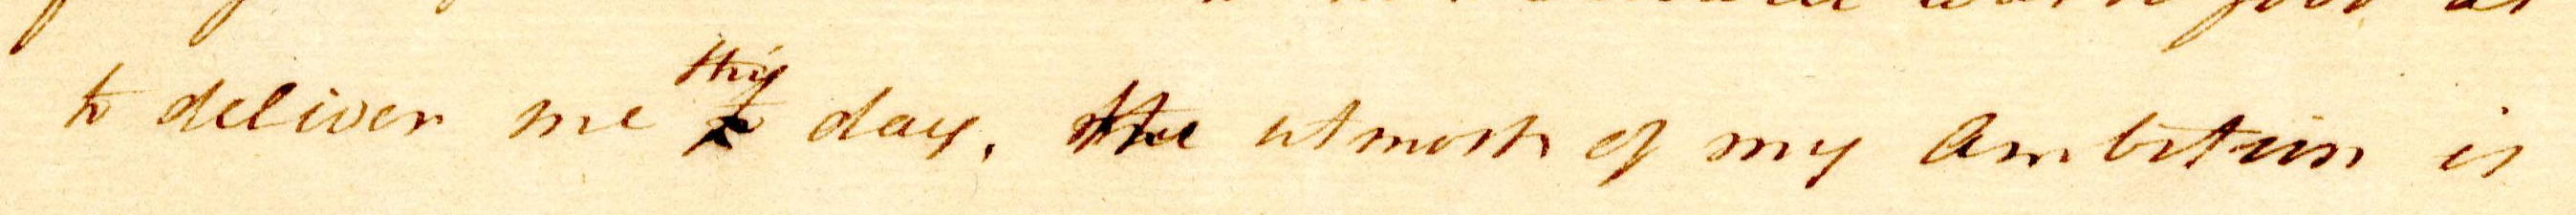to deliver me this day, the utmost of my Ambition is
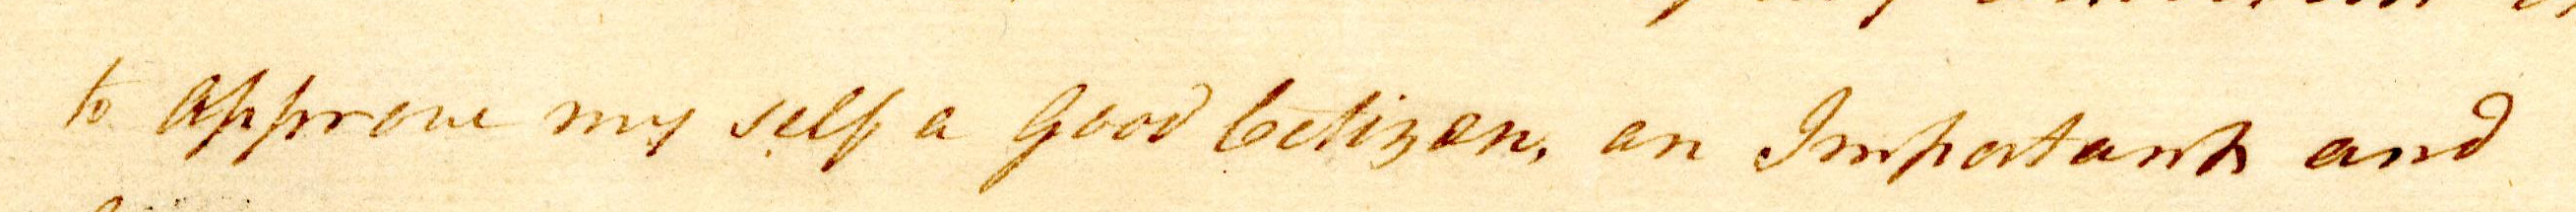to approve my self a good Citizen, an Important and
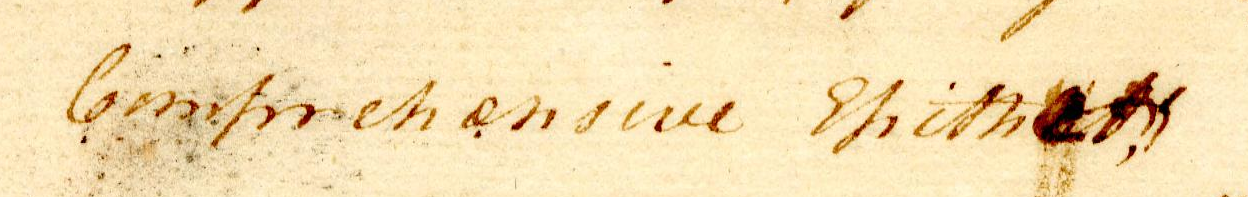Comprehensive Epithet
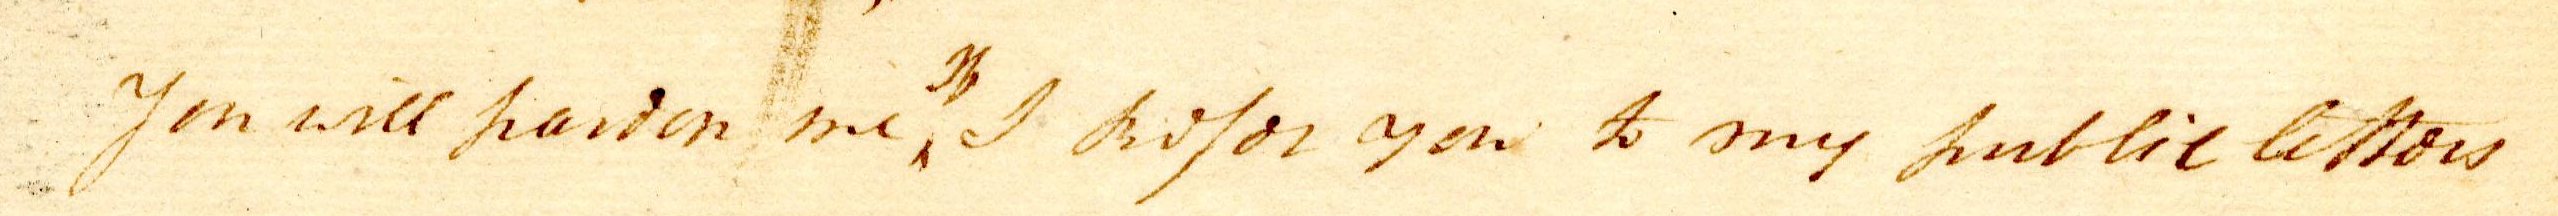You will pardon me, I refer you to my public letters
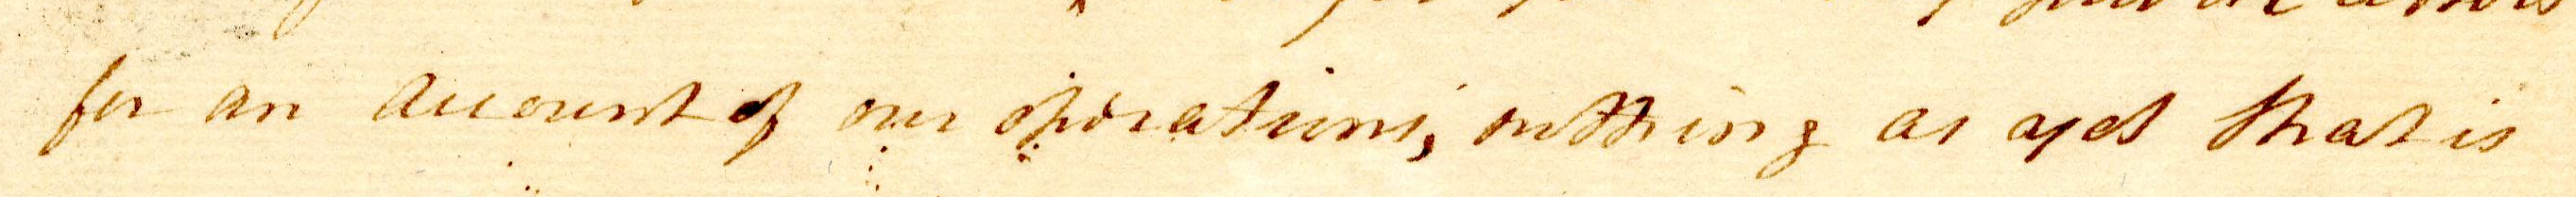for an account of our operations, nothing as yet that is
